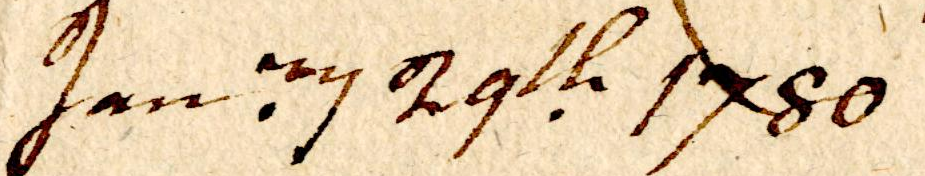Jan^y 29^th. 1780
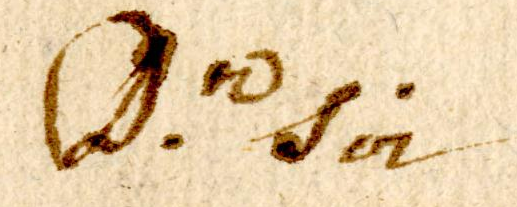D^r. Sir
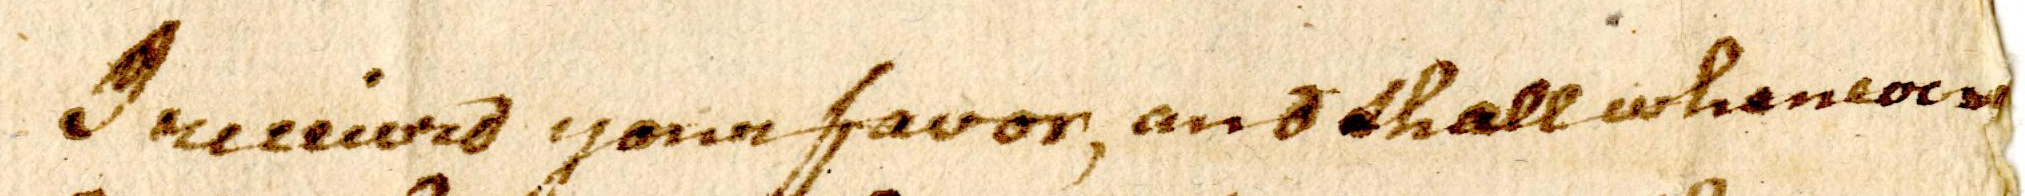I received your favor, and shall whenever
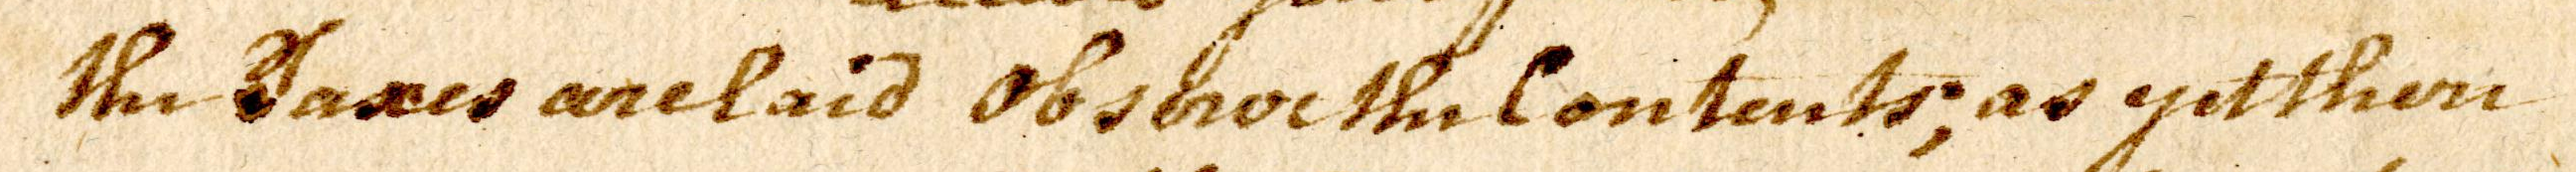the Taxes are laid observe the Contents; as yet there
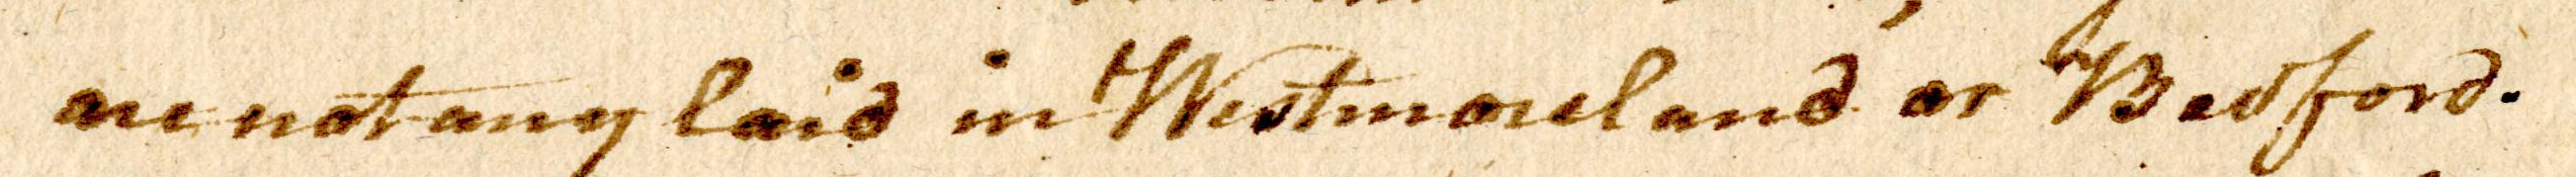are not any laid in Westmoreland or Bedford.
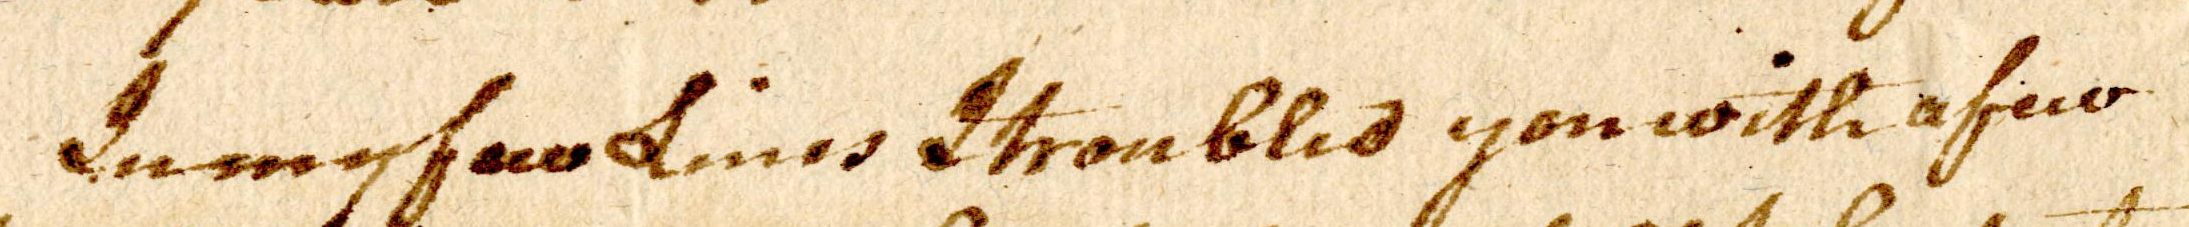In my few Lines I troubled you with a few
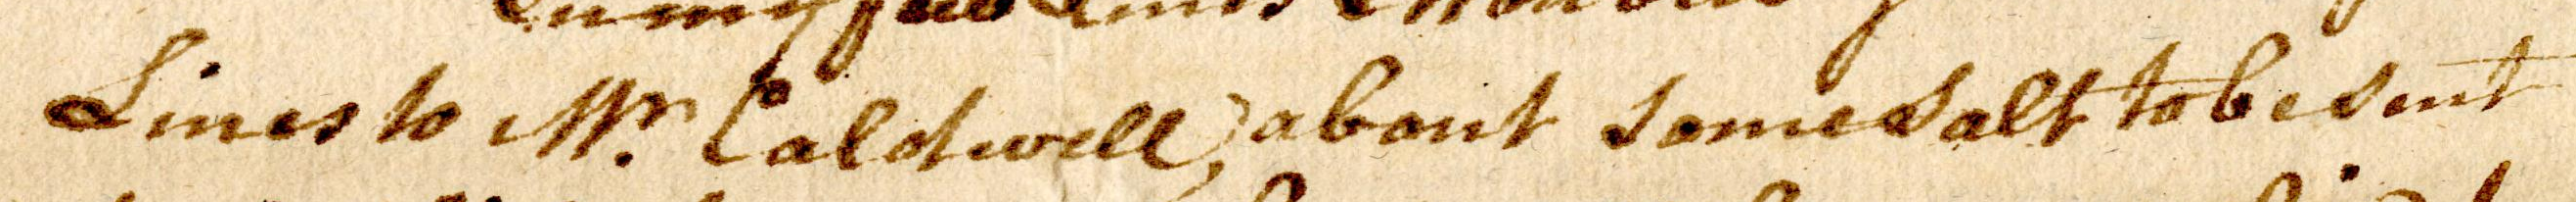Lines to M^r. Caldwell about some salt to be sent
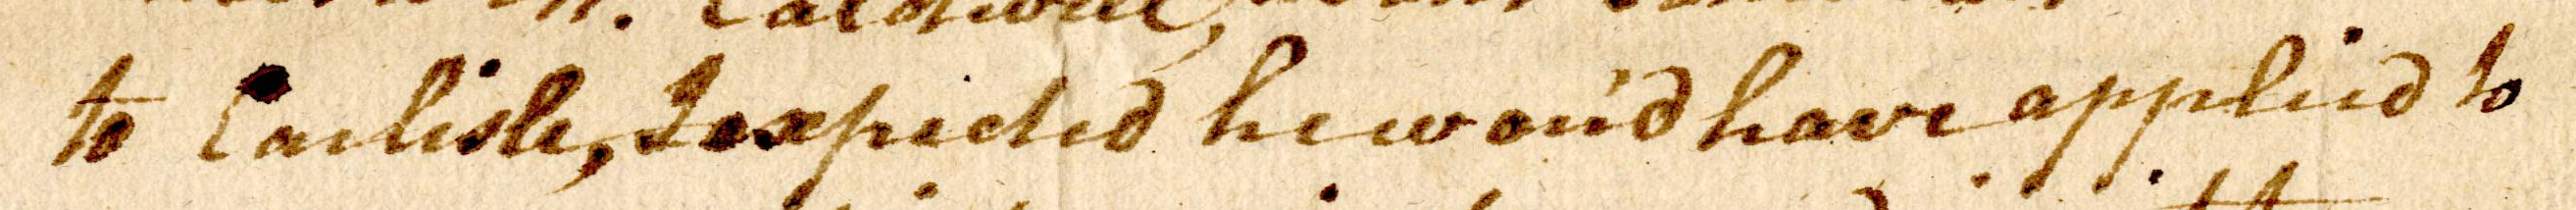to Carlisle, I expected he wou'd have applied to
